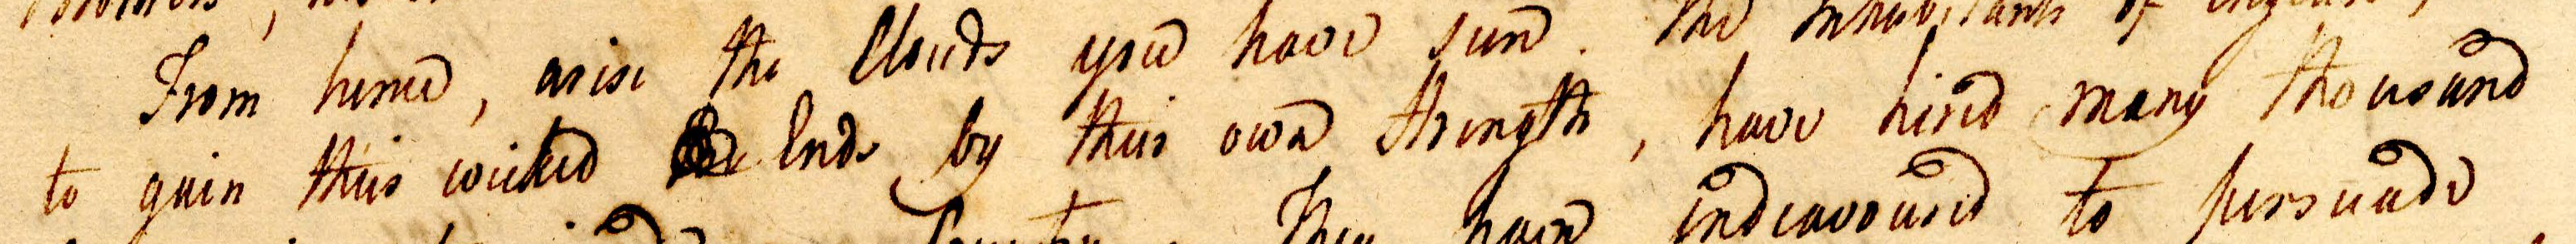to gain these wicked Ends by their own Strength, have hired many thousand
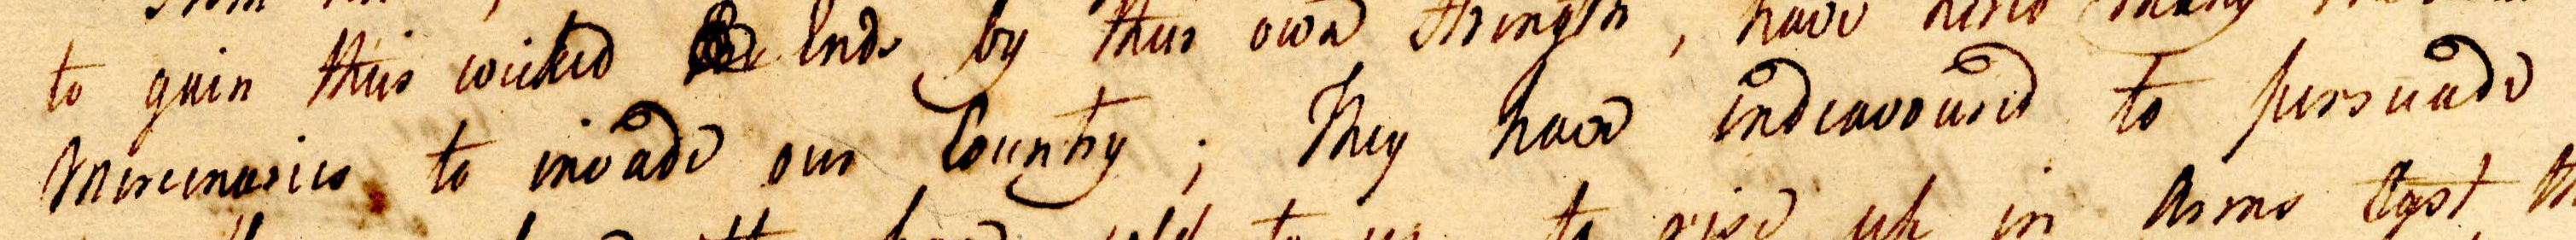mercenaries to invade our Country; They have endeavoured to persuade
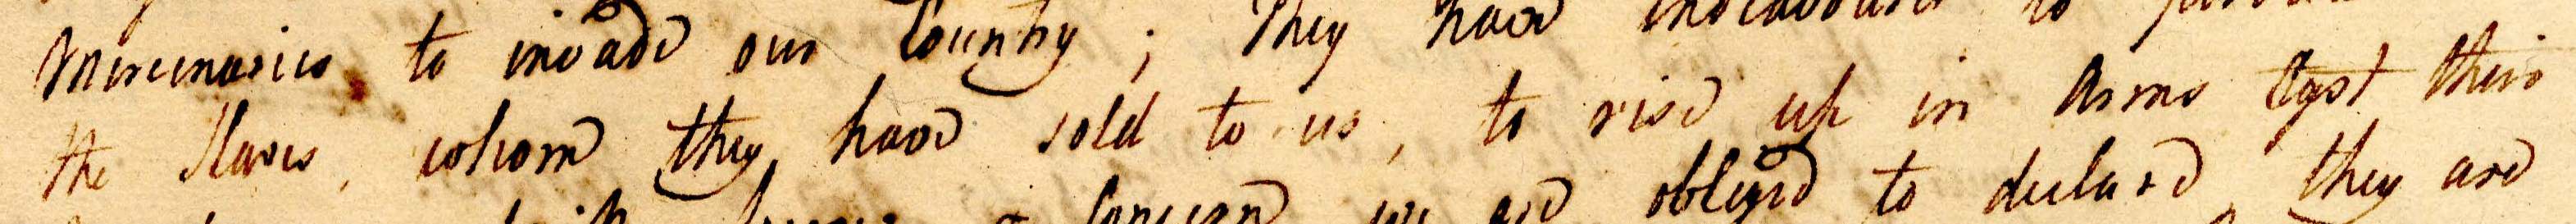the Slaves, whom they have sold to us, to rise up in Arms Agst their
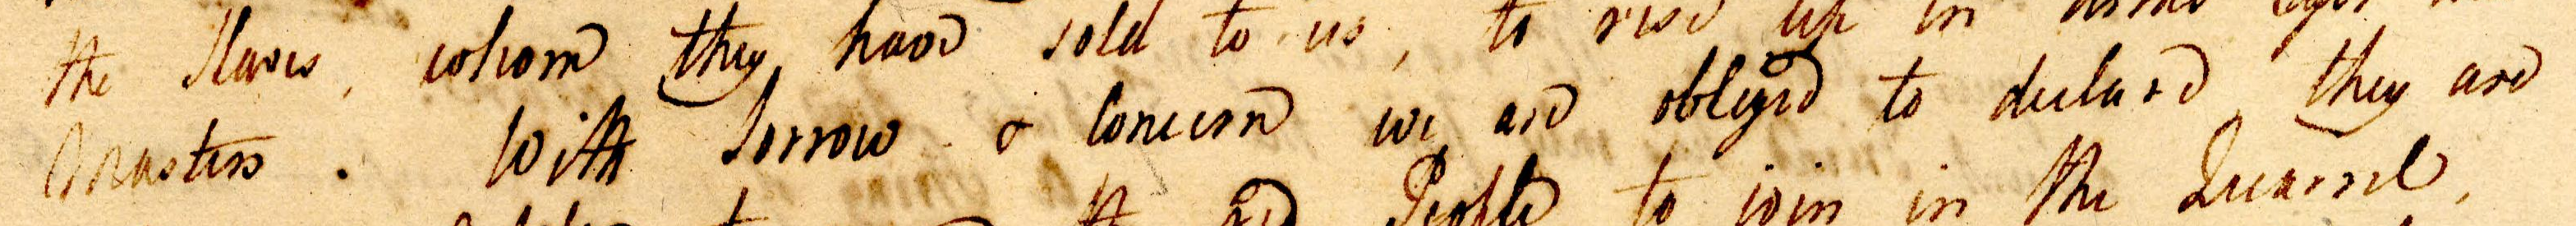Masters. With Sorrow & Concern we are obliged to declare they are
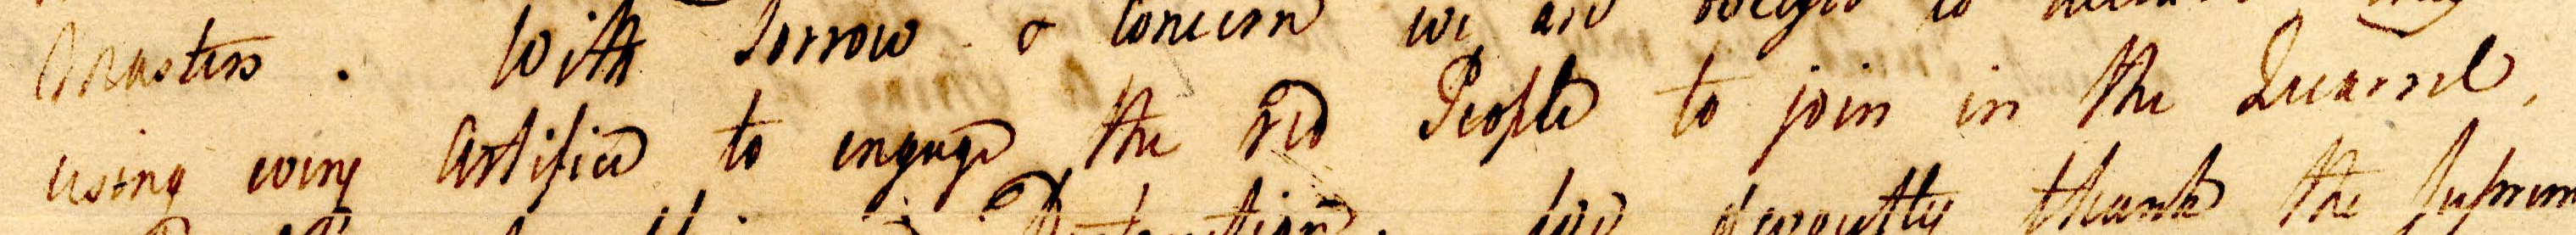using every Artifice to engage the red People to join in the Quarrel
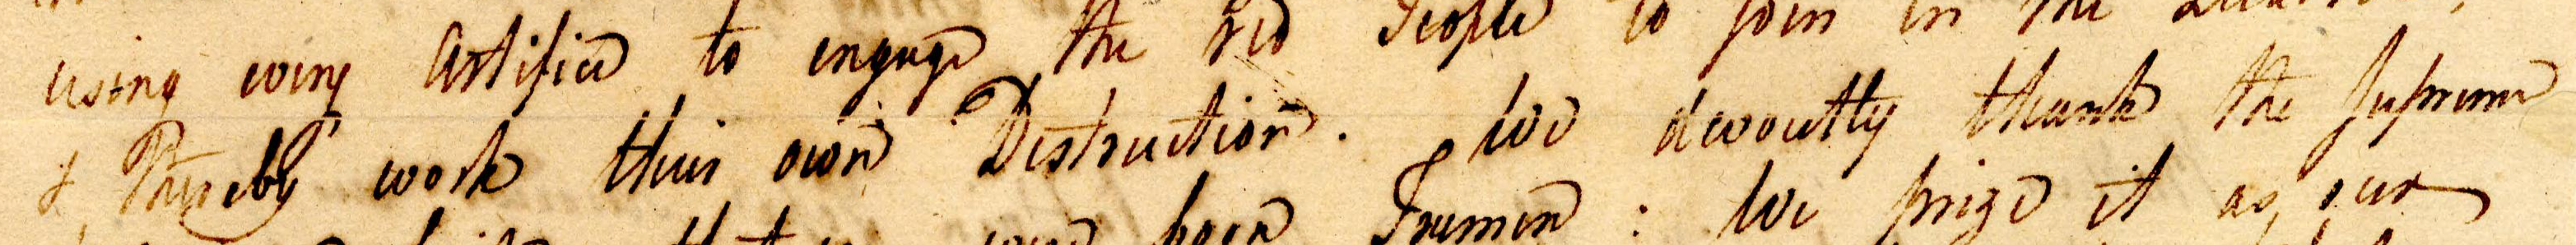& thereby work their own Destruction. We devoutly thank the Supreme
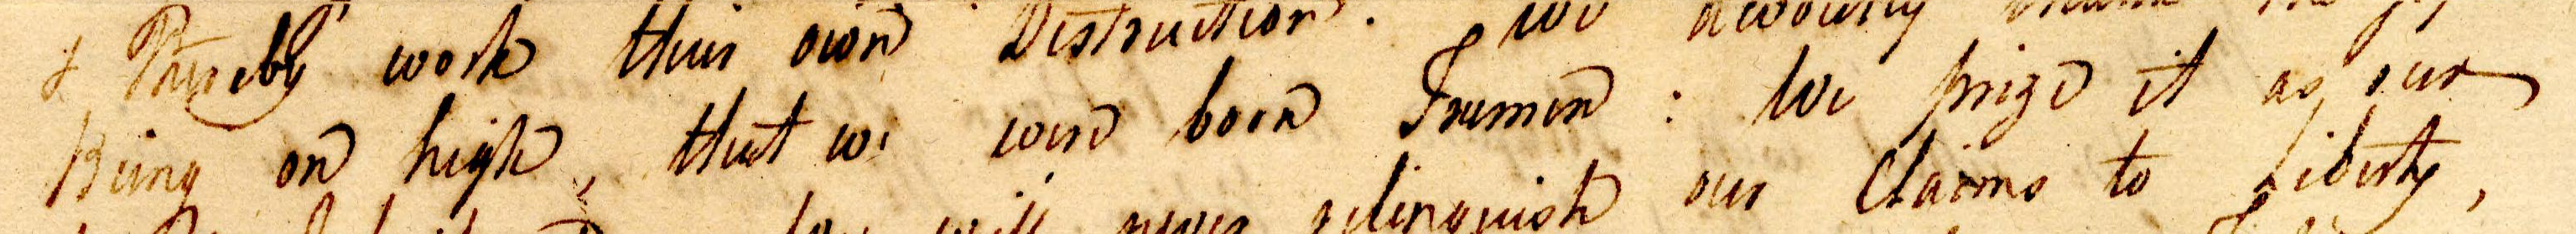Being on high, that we were born Freemen: We prize it as our
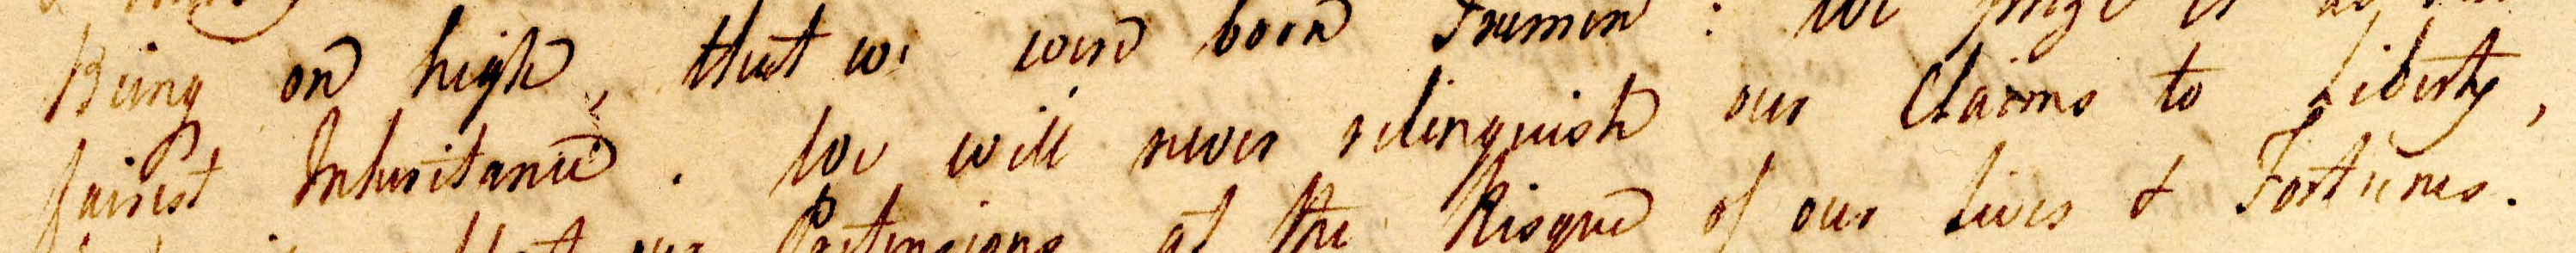fairest Inheritance. We will never relinquish our Claims to Liberty,
